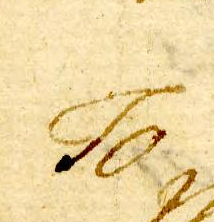To
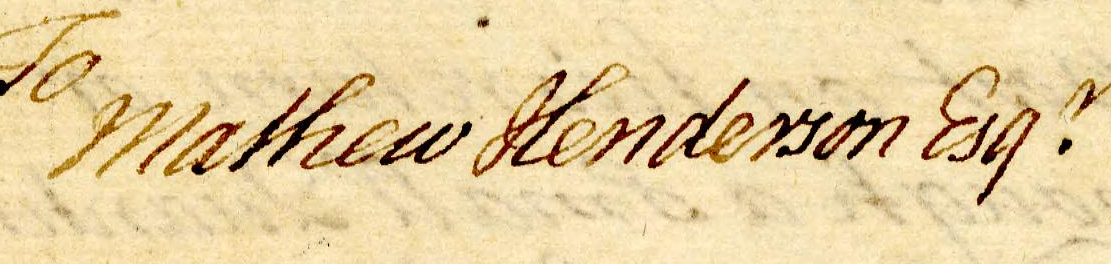Mathew Henderson Esq^r.
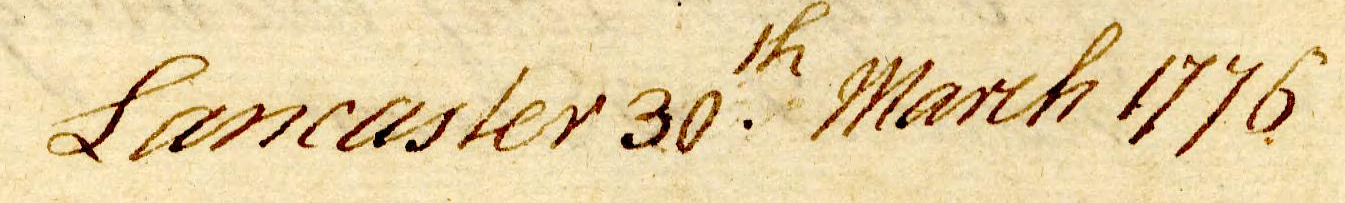Lancaster 30^th. March 1776
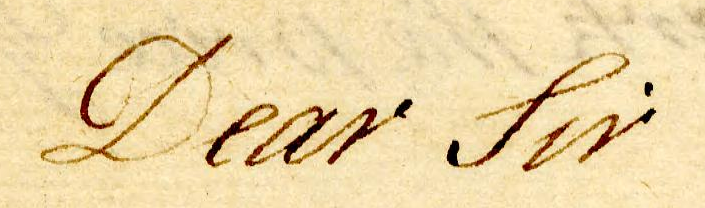Dear Sir
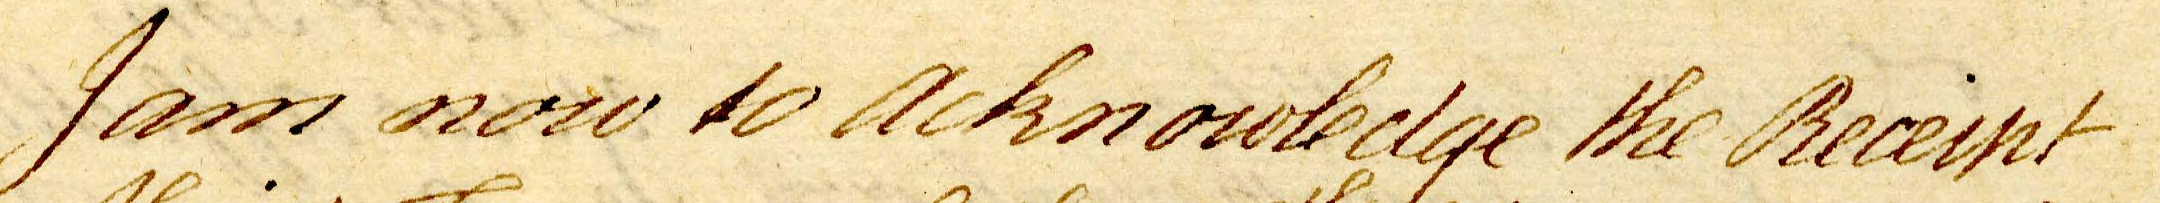I am now to Acknowledge the Receipt
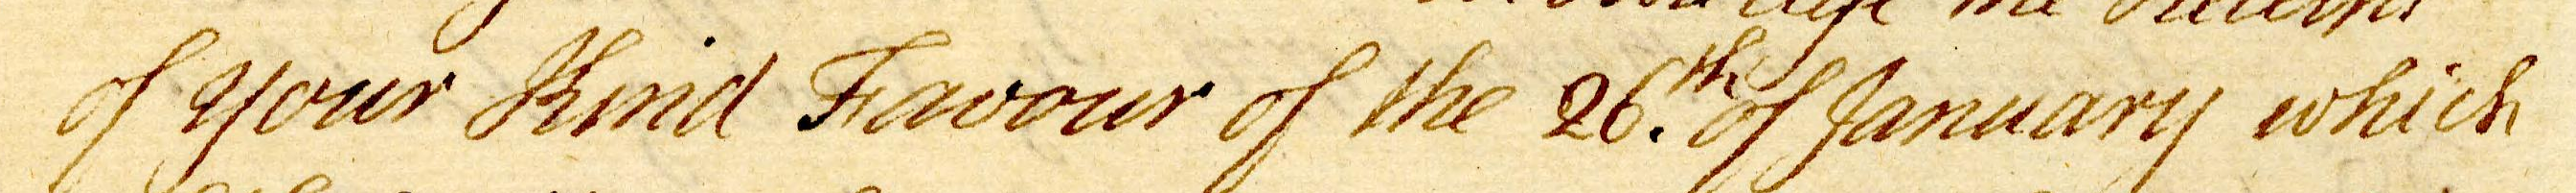of Your Kind Favour of the 26^th. of January which
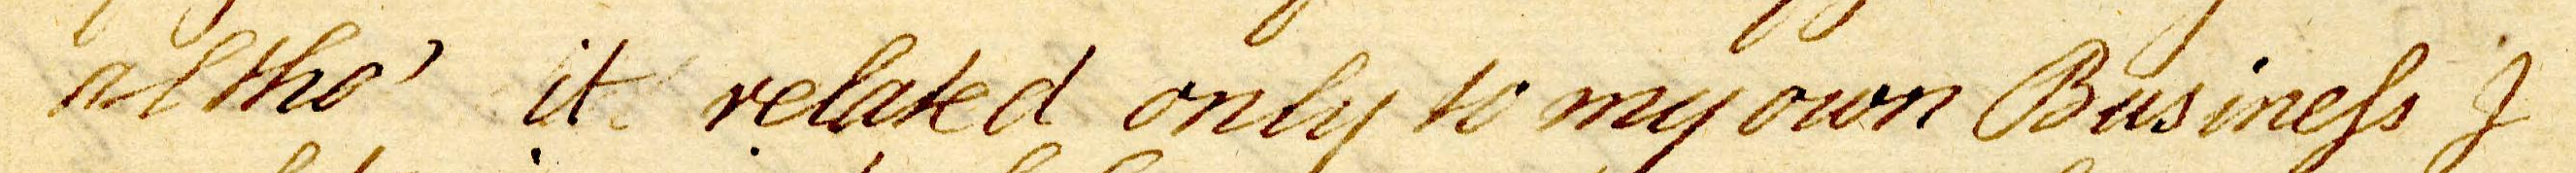altho it related only to my own Business I
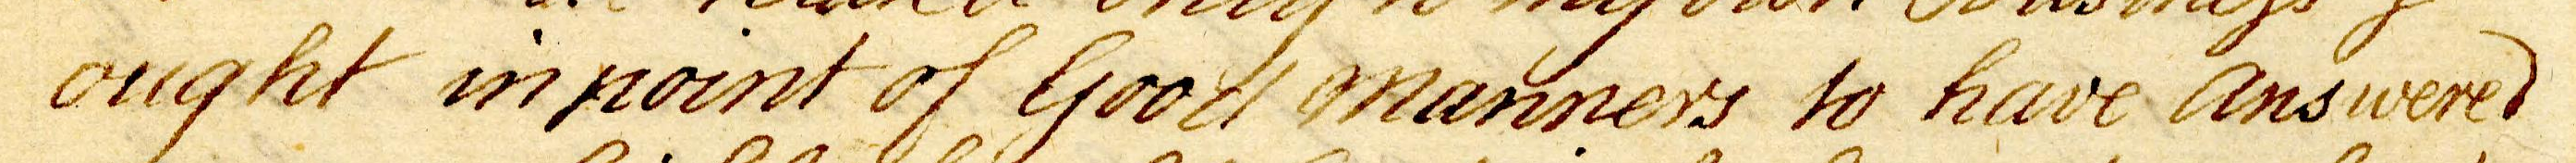ought in point of Good Manners to have Answered
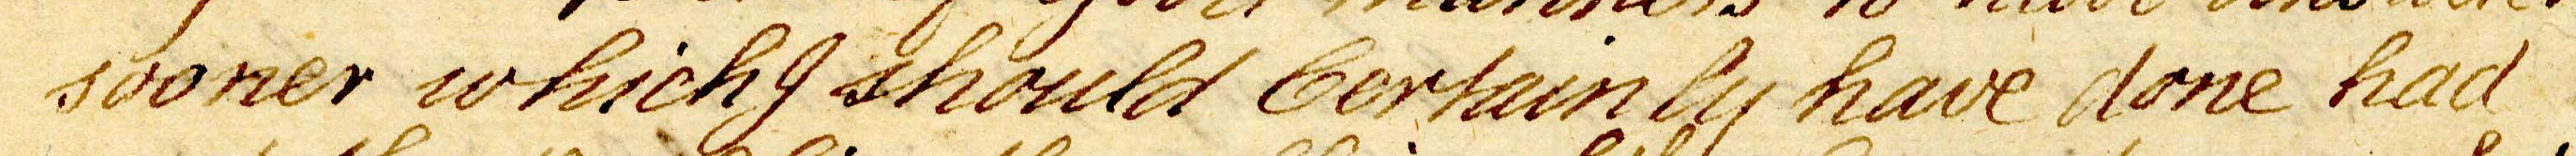sooner which I should Certainly have done had
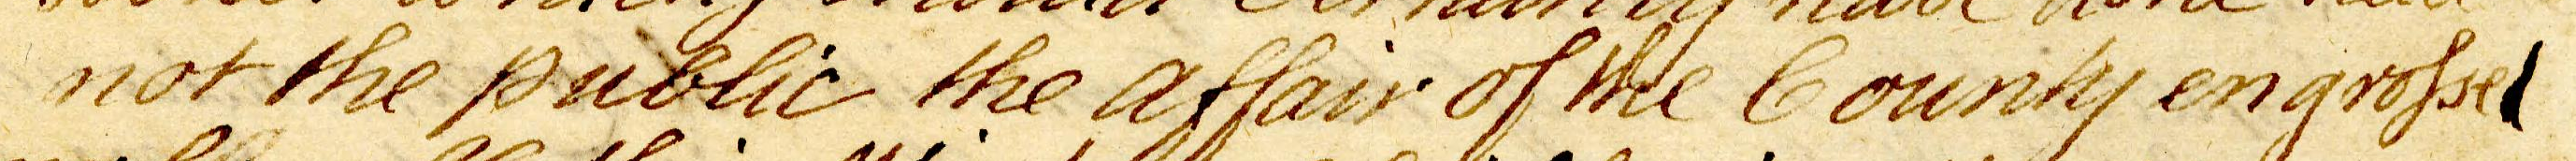not the public the Affair of the County engrossed
